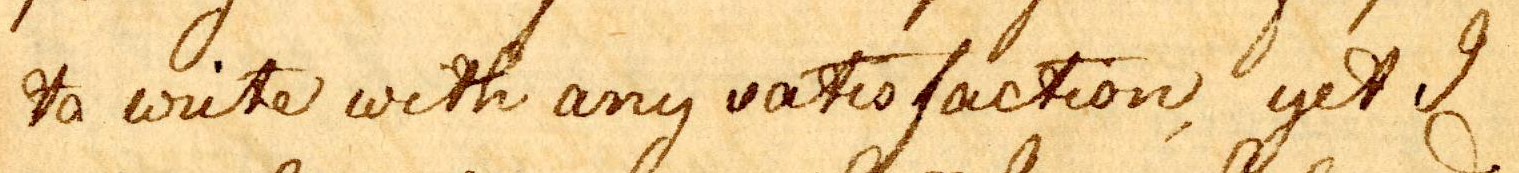to write with any satisfaction, yet I
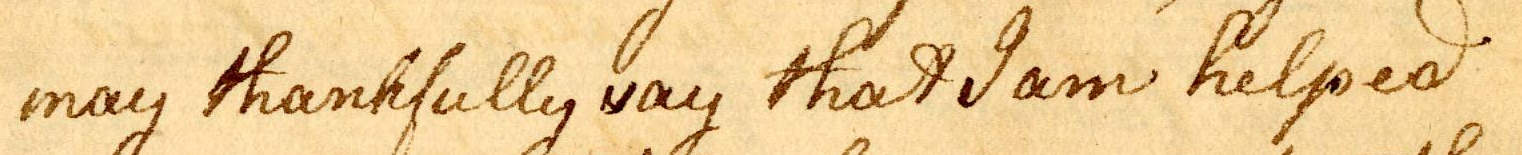may thankfully say that I am helped
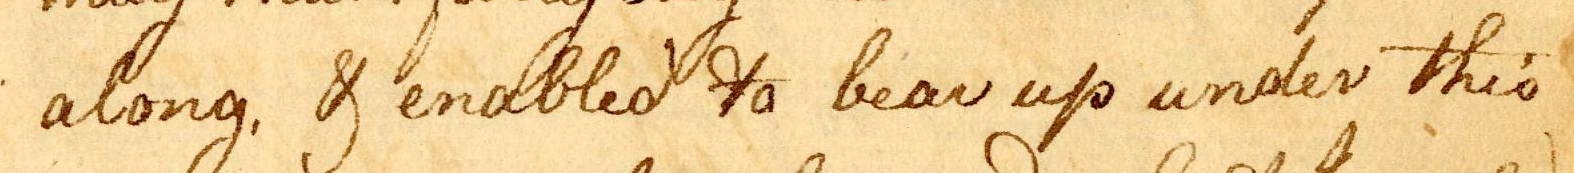along, & enabled to bear up under this
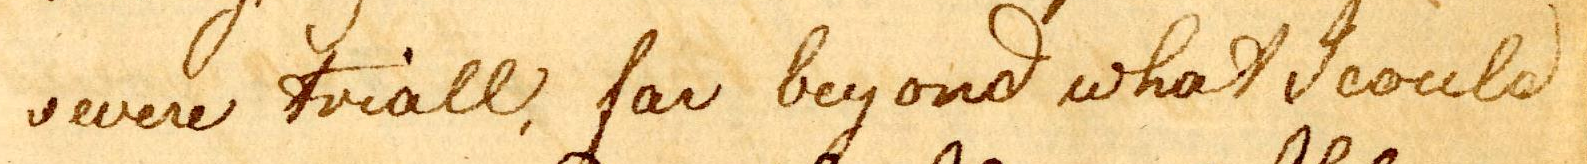severe triall far beyond what I could
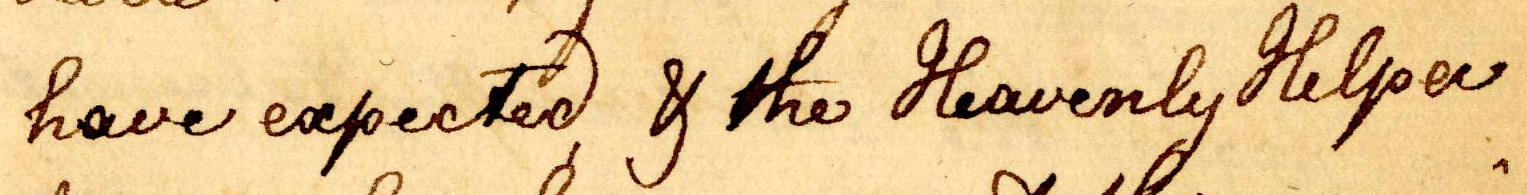have expected, & the Heavenly Helper
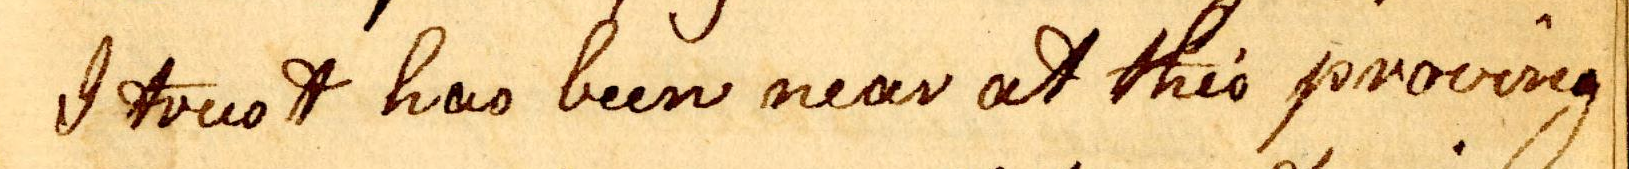I trust has been near at this proving
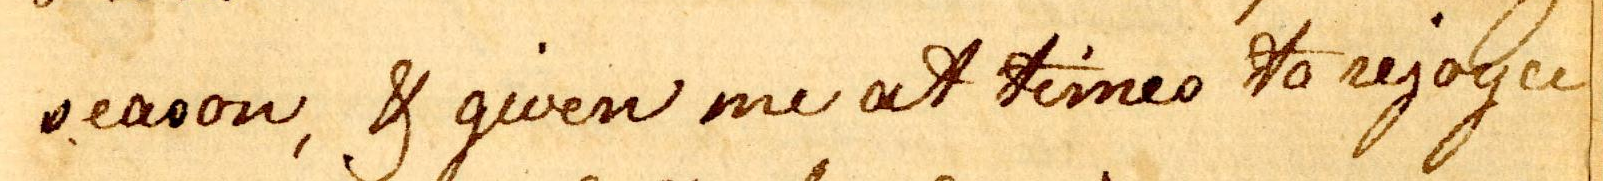season, & given me at times to rejoyce
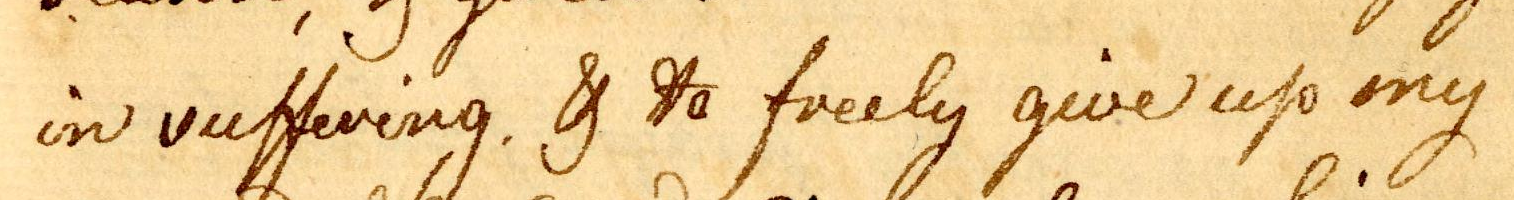in suffering. & to freely give up my
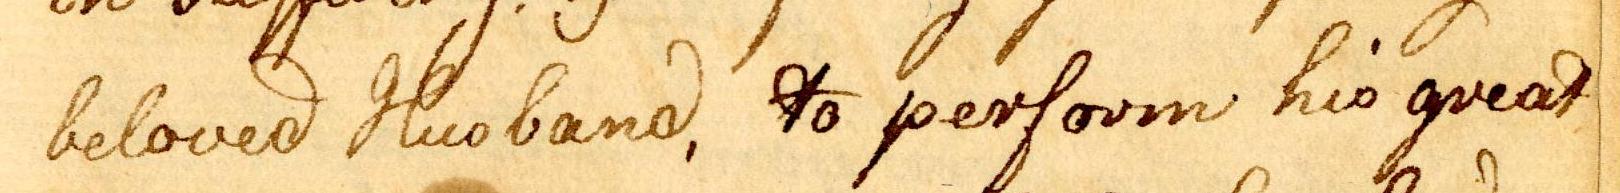beloved Husband, to perform his great
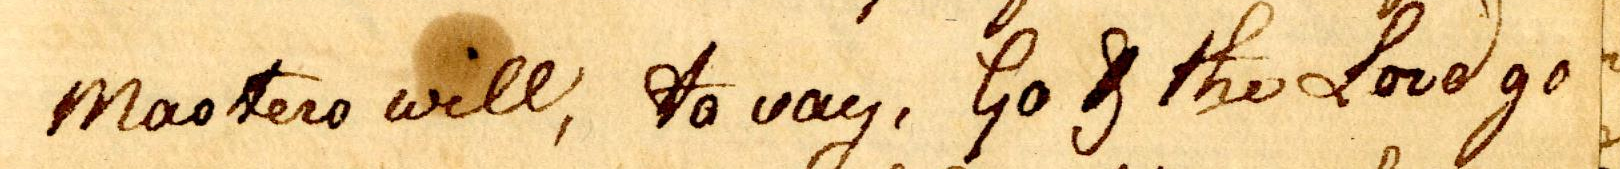Masters will, to say, Go & the Lord go
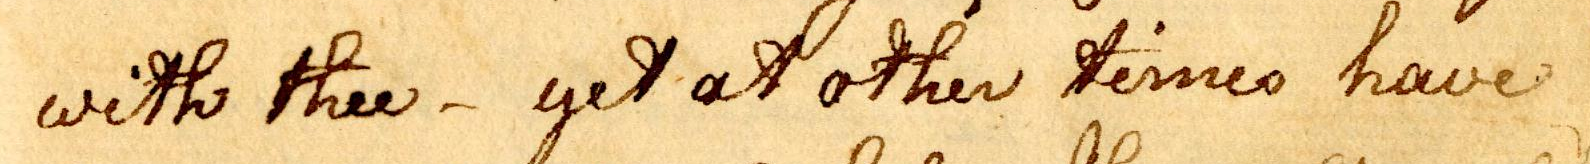with thee- yet at other times have
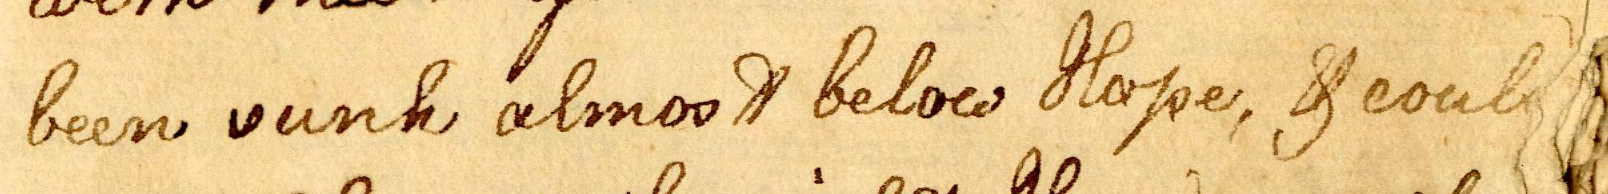been sunk almost below Hope, & could
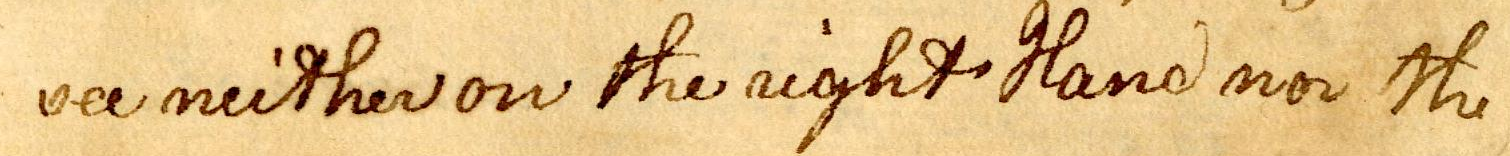see neither on the right Hand nor the
